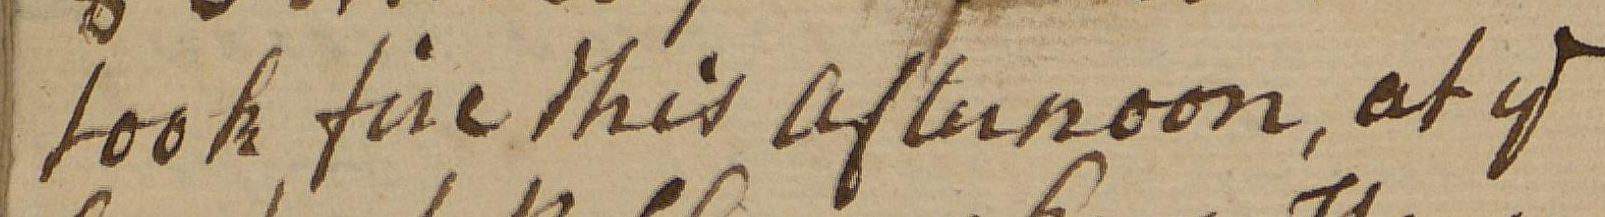took fire this afternoon, at y^e
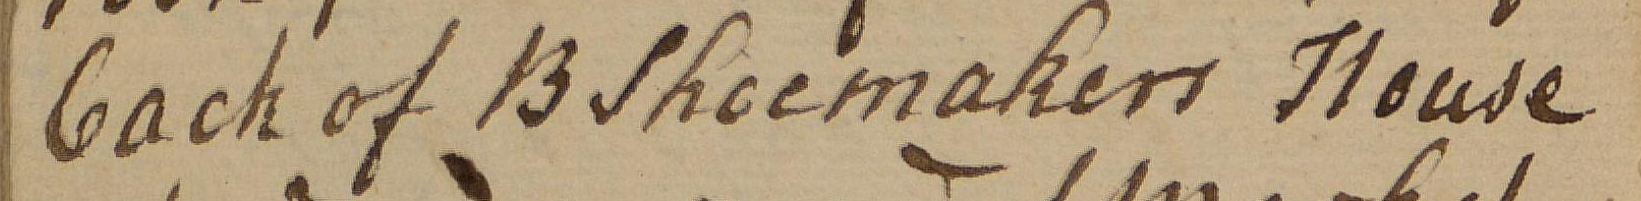back of B Shoemakers House
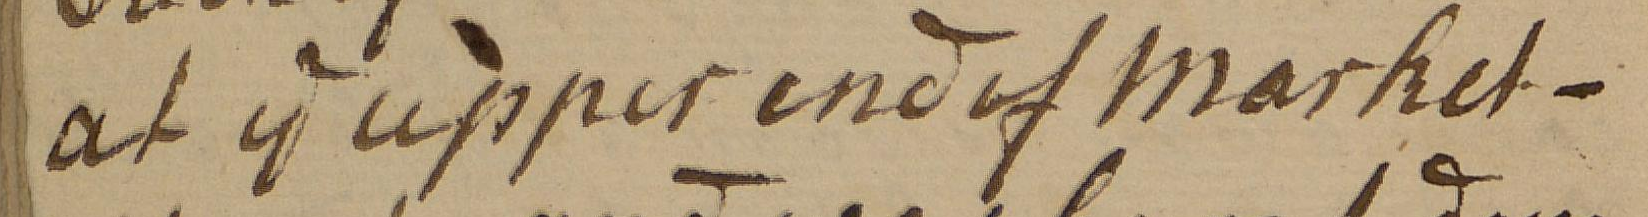at y^e upper end of Market-
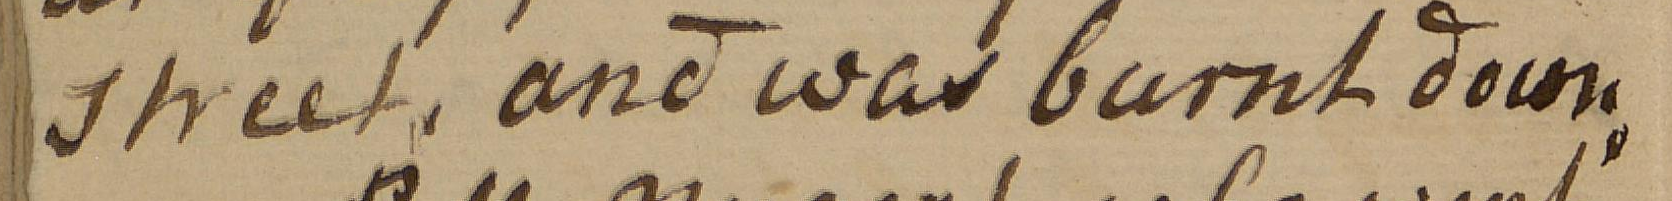Street, and was burnt down,
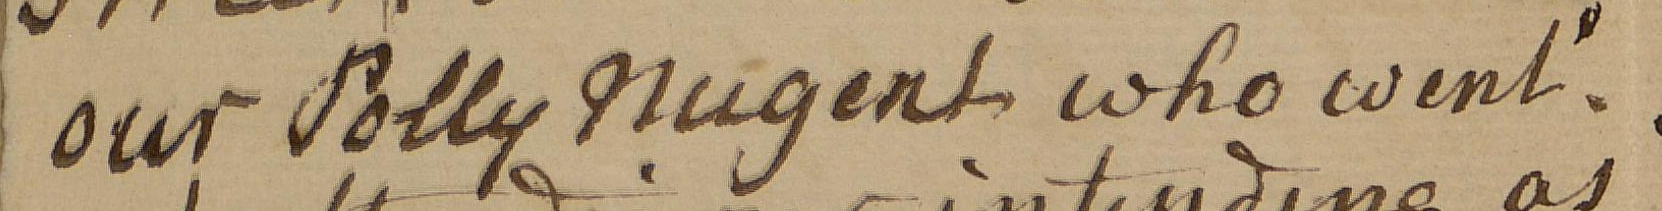our Polly Nugent who went.
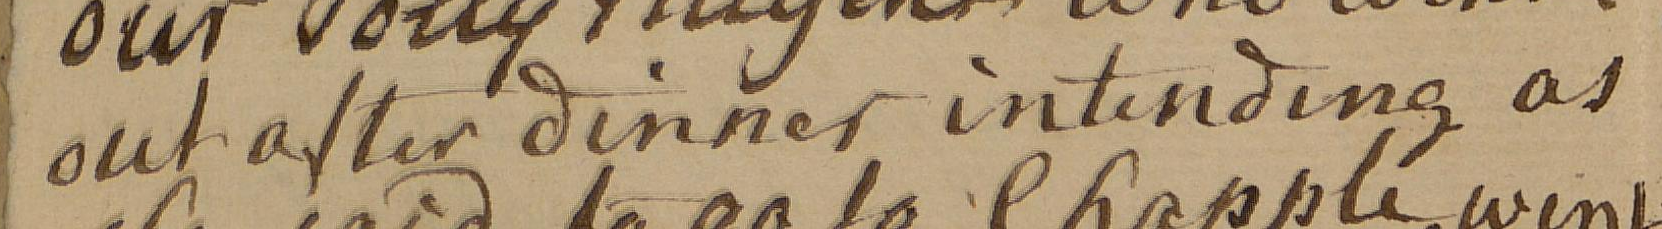out after dinner intending as
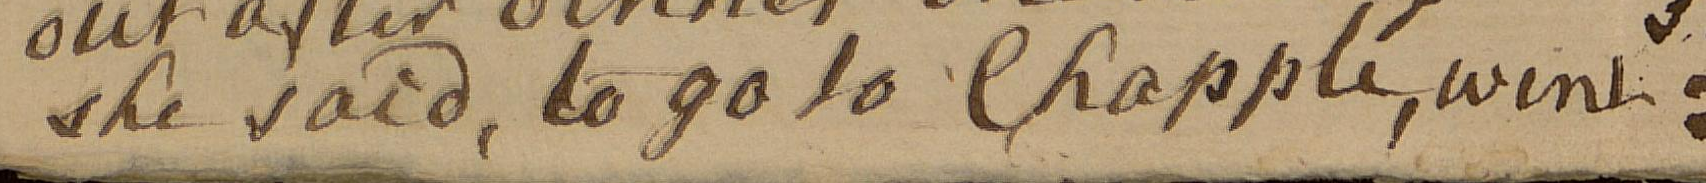she said, to go to Chapple, went
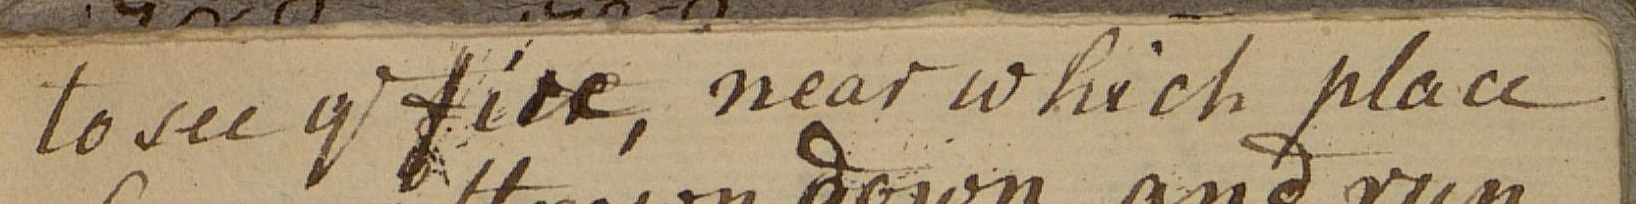to see y^e fire, near which place
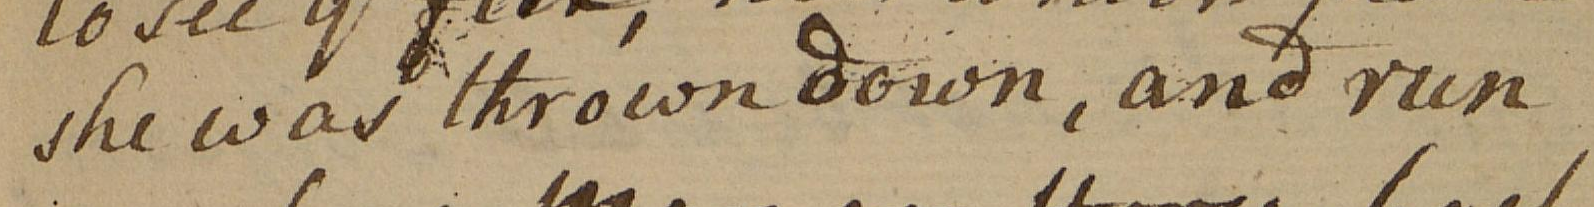she was thrown down, and run
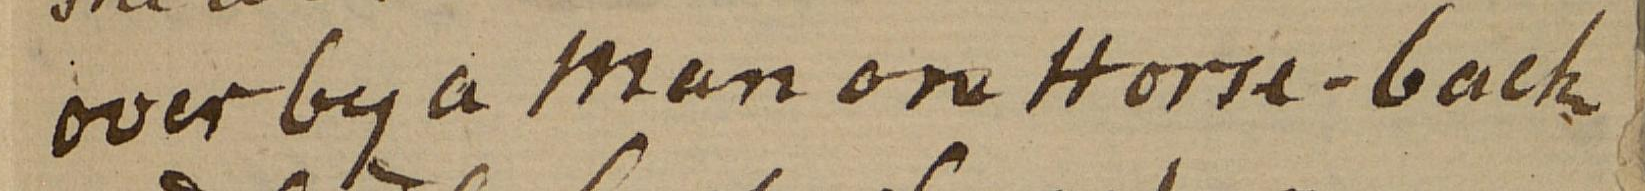over by a man on Horse- back
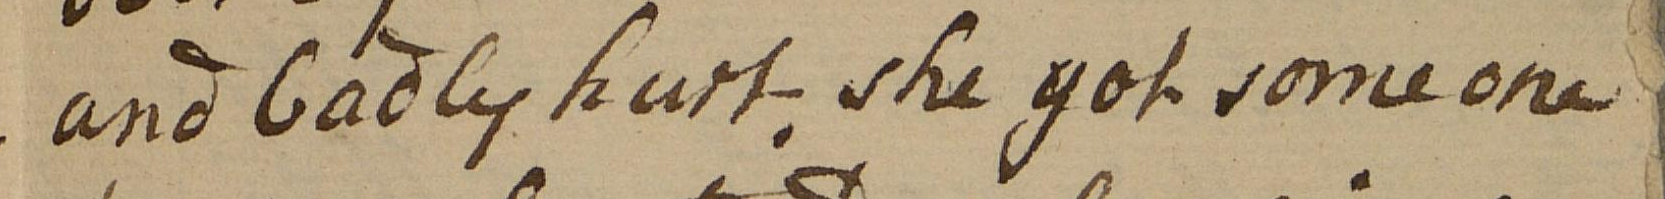and badly hurt. she got someone
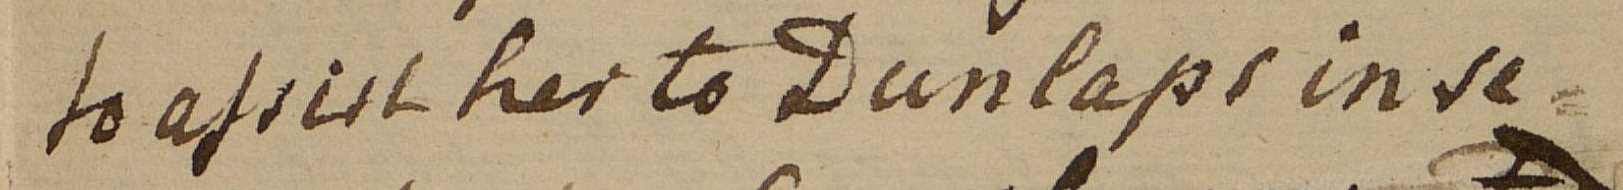to assist her to Dunlaps in se-
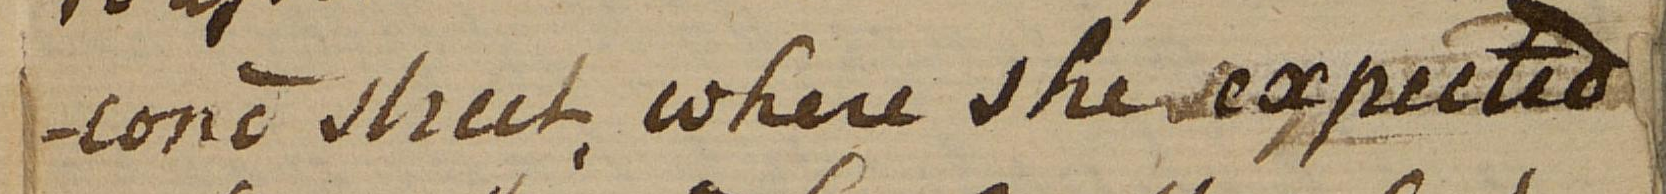-cond street, where she expected
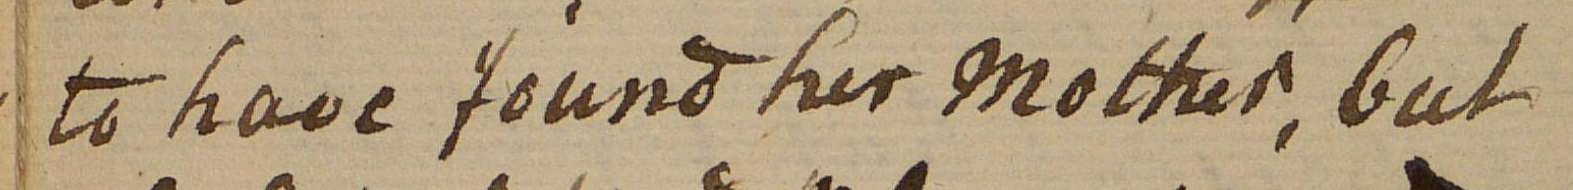to have found her Mother, but
